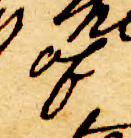of
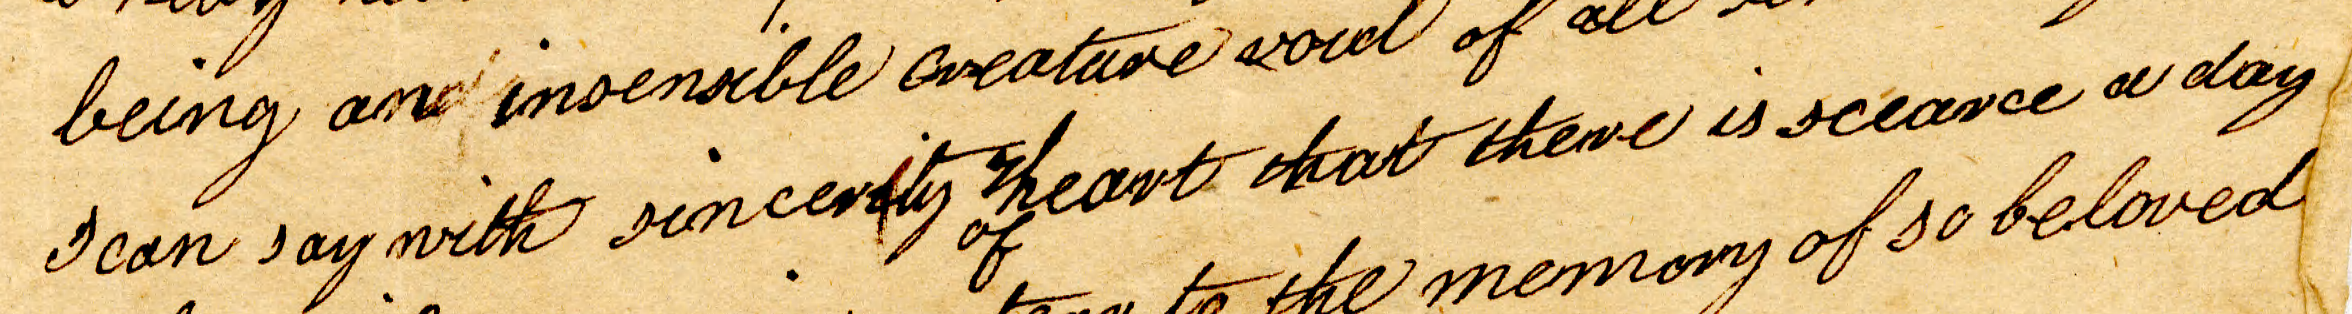I can say with sincerity ^ heart that there is scarce a day
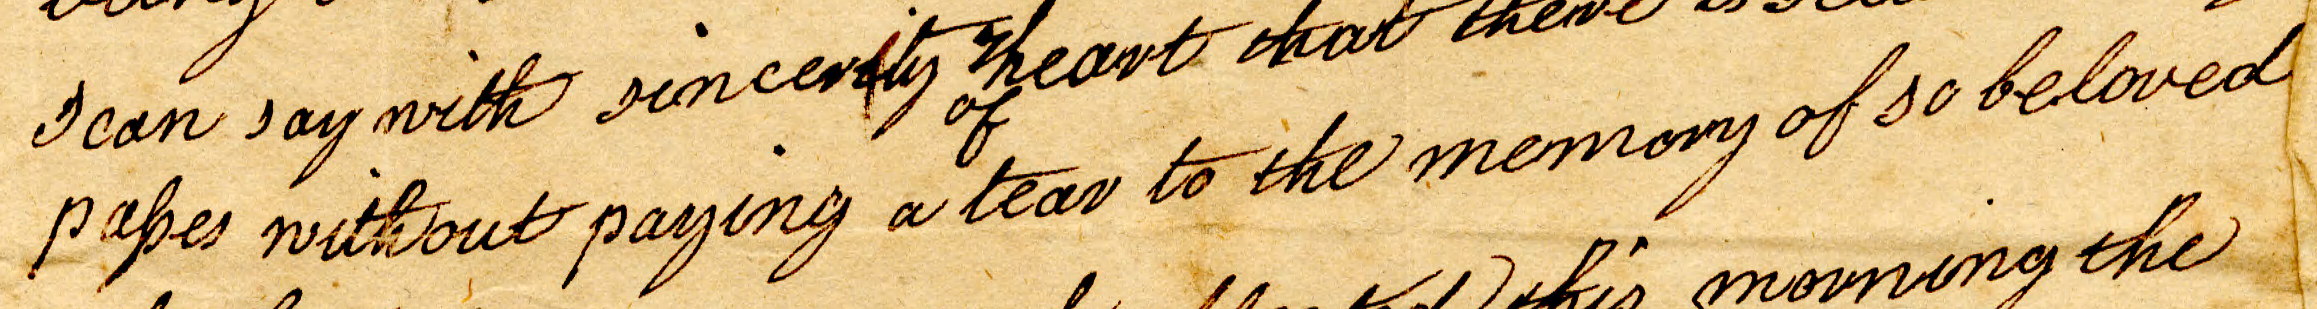passes without paying a tear to the memory of so beloved
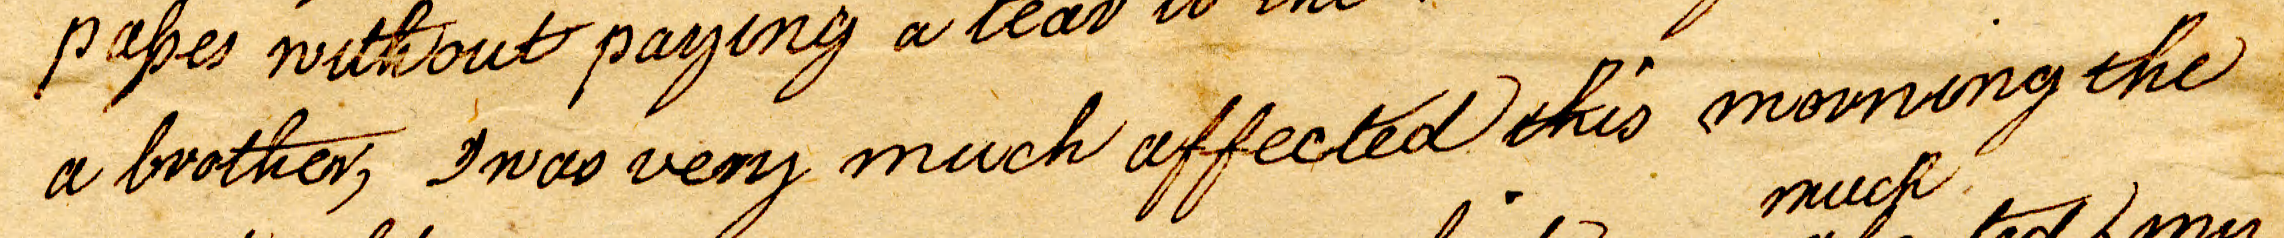a brother, I was very much affected this morning the
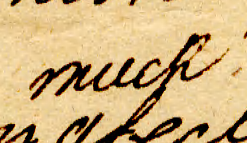much
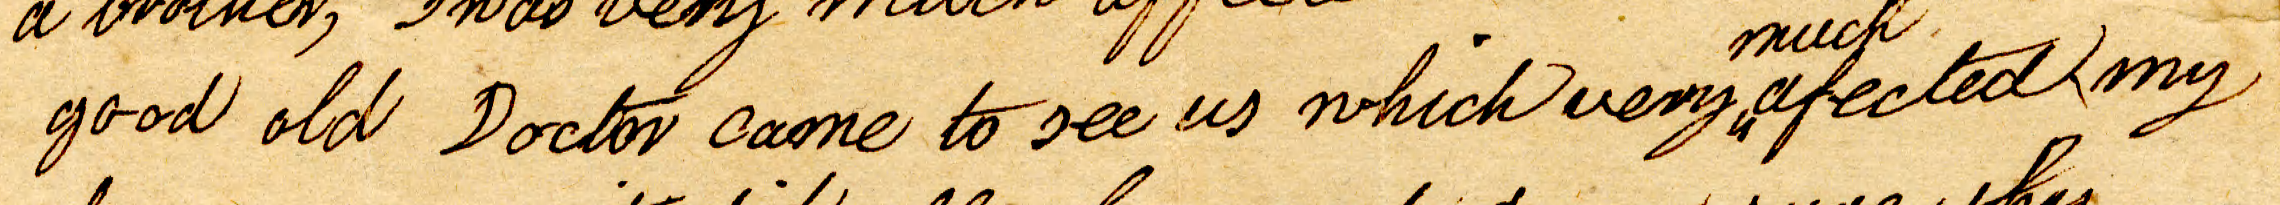good old Doctor came to see us which very ^ afected my
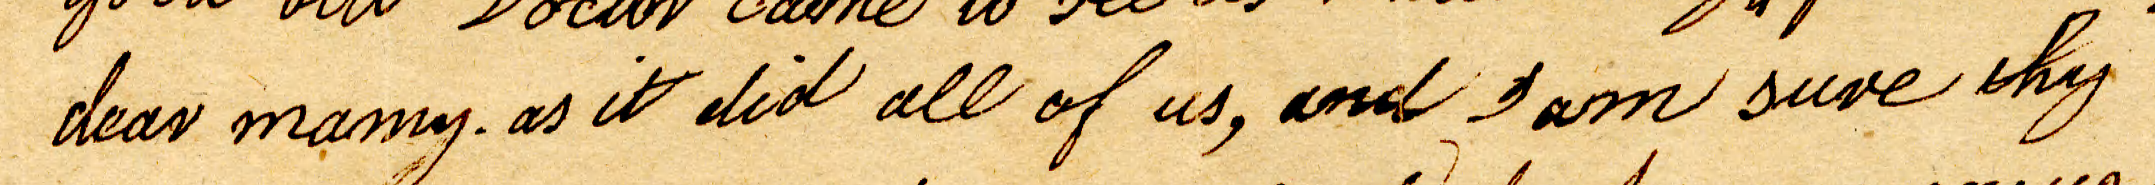dear mamy as it did all of us, and I am sure thy
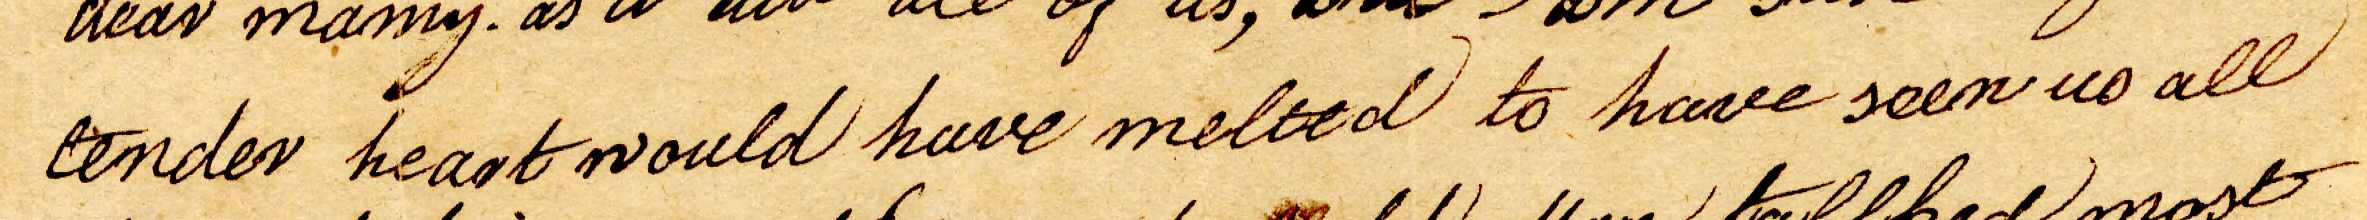tender heart would have melted to have seen us all
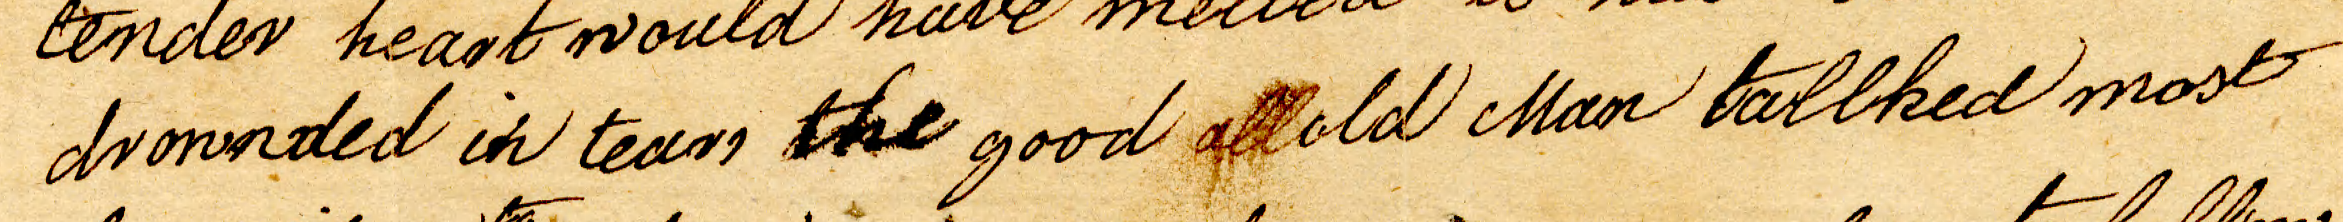drownded in tears the good [all] old man talked most
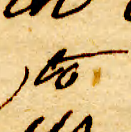to
